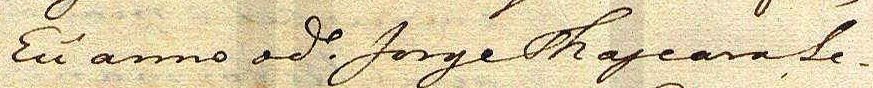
hū anno o d.o Jorge Mascara Le
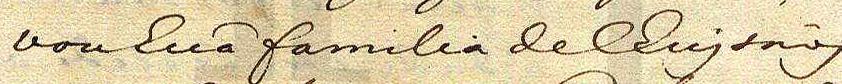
vou huā familia de Christaõs
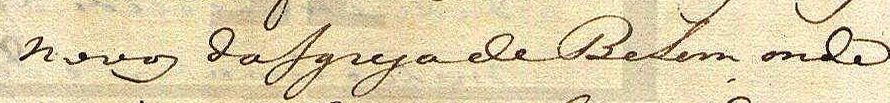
novos da Jgreja de Belem, onde
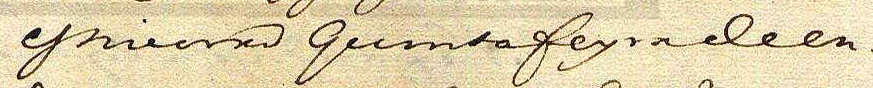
estiveraõ quinta feyra de en
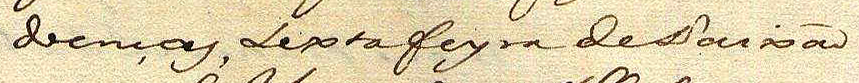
doenças, sexta feyra de Paixaõ
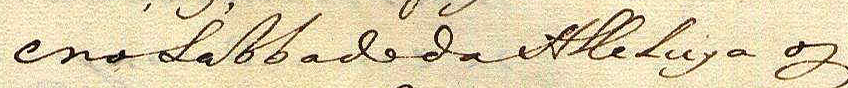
e no Sabbado da AlleLuya os
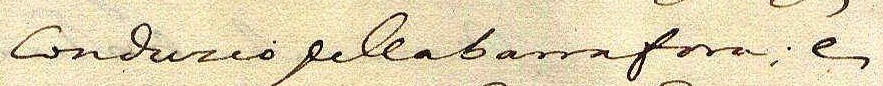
Conduzio pella barra fora; e
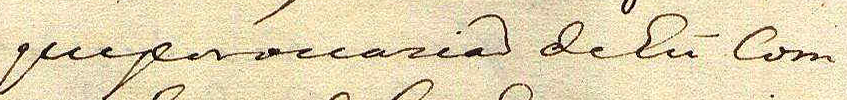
que por occaziaõ de hū Com
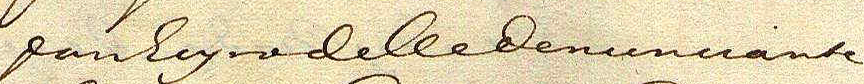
panheyro delle denunciante
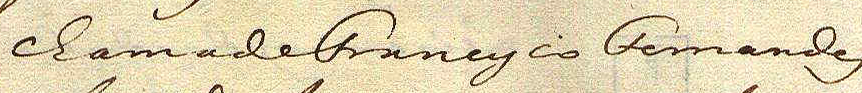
chamado Francisco Fernandes
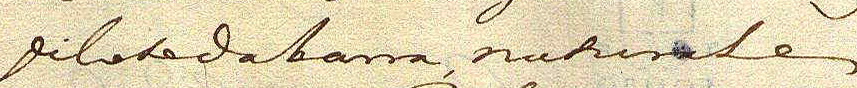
piloto da barra, natural e
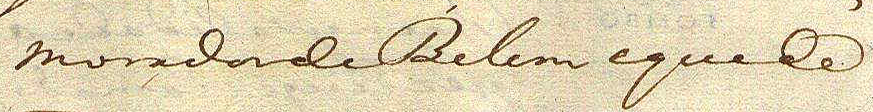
morador de Belem e que de
